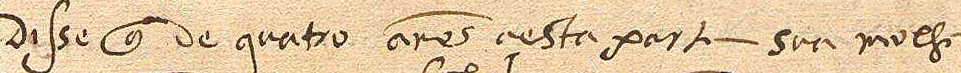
disse q̄ de quatro ānos aesta parte sua molher
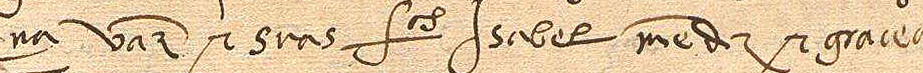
Cna vāz e suas fas Jsabel m̄edez e gracea
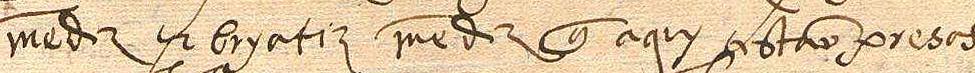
m̄edez e bryatiz m̄edez q̄ aquy estão presas
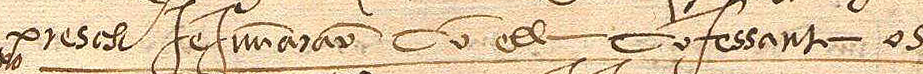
presas JeJūuarão cō elle Cōfessante os
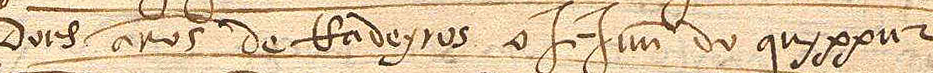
Dous ānos deRadeyros o JeJuū do quyppur
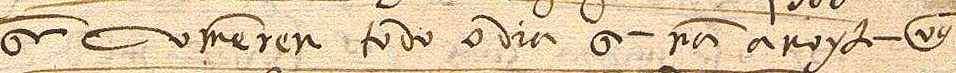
s̄e Com̄eren todo o dia sen̄a a noyte o q̄
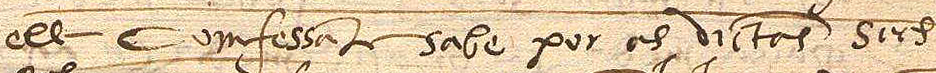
elle Comfessāte sabe por as dic̄tas suas
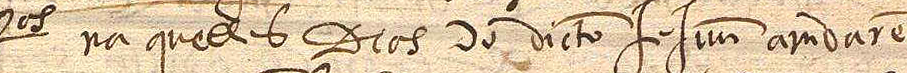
fas naquelles Dias do dic̄to JeJūu amdarē
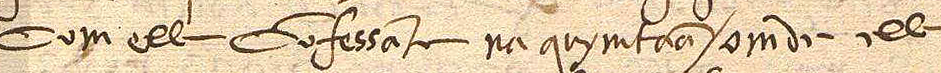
Com elle Cōfessāte na quyntaā / omde elle
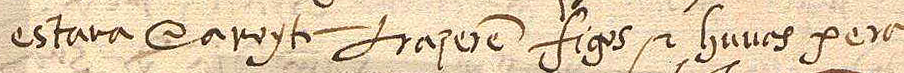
estaua e a noyte trazerē figos e huuas pera
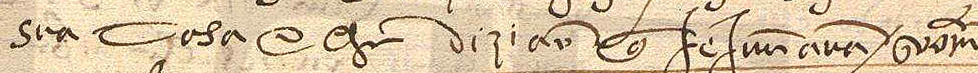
sua Casa e lhe dizião q̄ JeJūuaūa / soomte
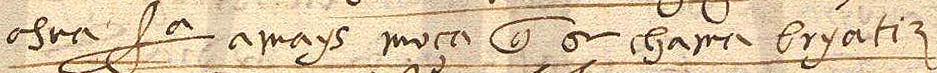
a sua fa a mays moça q̄ se chama bryatiz
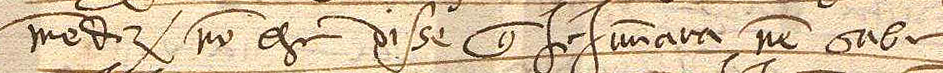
m̄edez / n̄o lhe disse q̄ JeJūuaua n̄e sabe
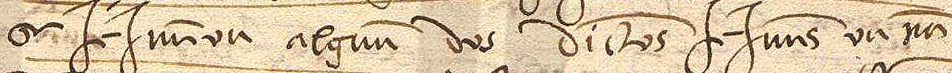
se JeJuūou alguū dos dīctos JeJuūs ou n̄a
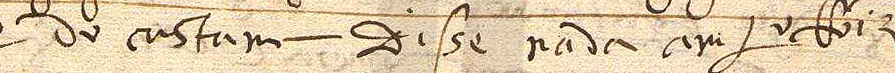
e do custume Disse nada amto Rōiz
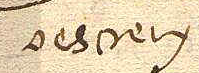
o escreuy
